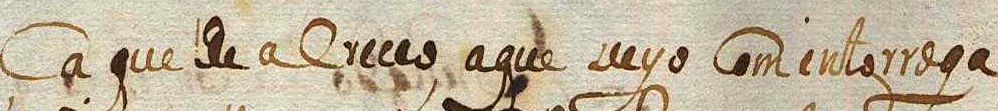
Ça que de acrecei, a que veyo Com interroga
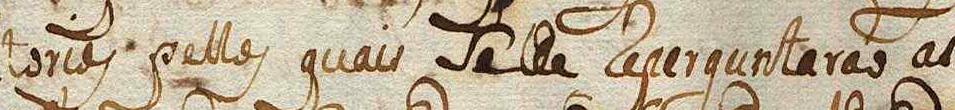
torios pellos quais Se lhe Reperguntarão as
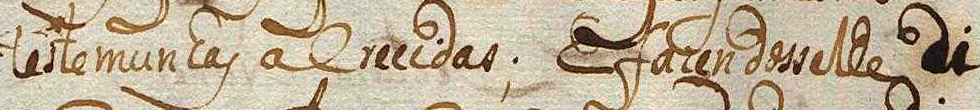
testemunhas aCrecidas; E fazendo se lhe di
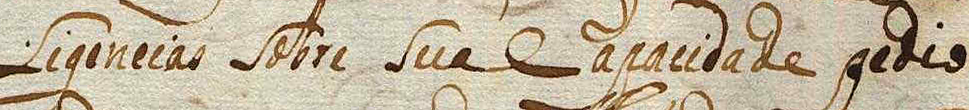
Ligencias Sobre Sua Capacidade pedio
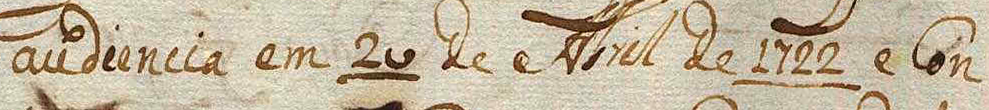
audiencia em 20 de Abril de 1722 e Con
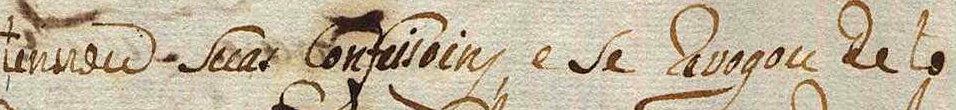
tinuou Suas Confissoins, e se Revogou de to
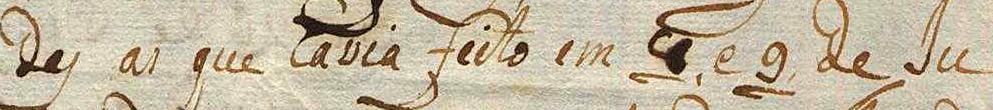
das as que havia feito em 8, e 9, de Ju
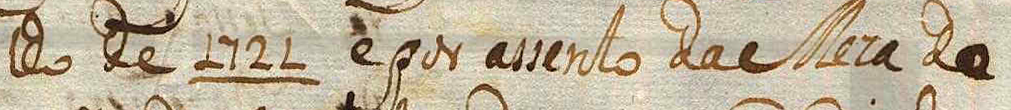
lho de 1721 e por assento da Meza do
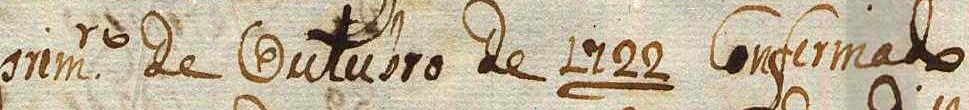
prim.ro de Outubro de 1722 Confirmado
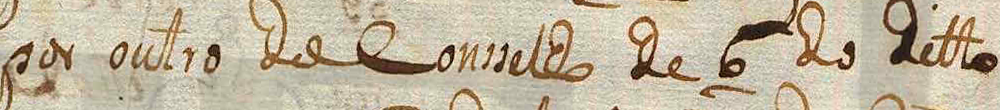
por outro do Consselho de 6 do ditto
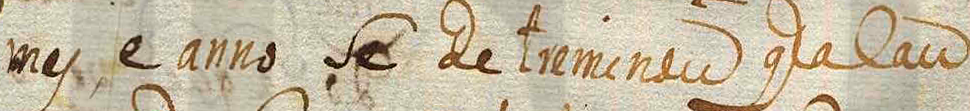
mes, e anno Se detreminou q̄ a Cau
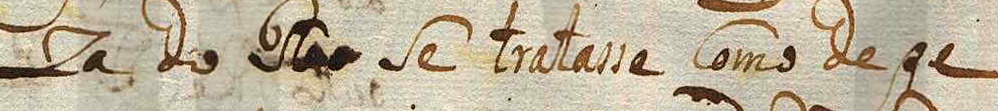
Za do Reo se tratasse Como de pe
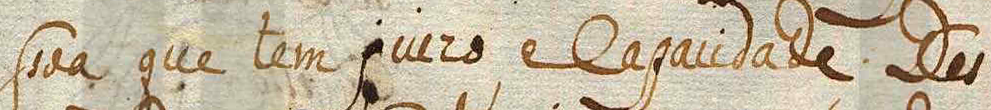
ssoa que tem juizo, e Capacidade Des
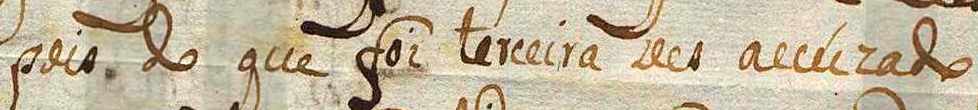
pois do que foi terceira ves accuzado,
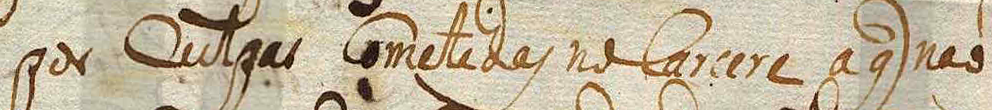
por Culpas Cometidas no Carcere a q̄ naõ
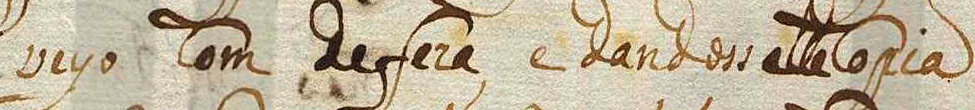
veyo Com defeza, e dandosselhe Copia
